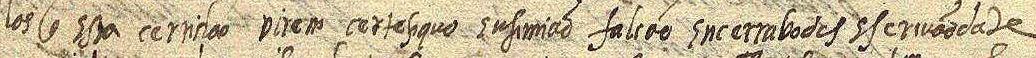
Aos q̄ Esta certidaõ virem certefiquo Eu simiaõ falcaõ Encerrabodes Escriuaõ dāte
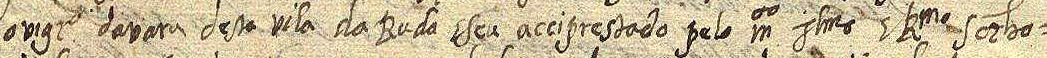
o vigro da vara desta vila daRuda E seu acciprestado pelo mto Jlmo E Rmo sor̄ ho
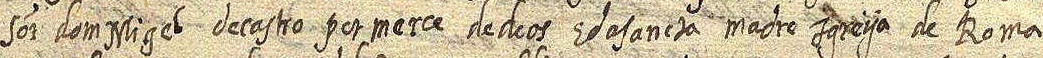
sōr dom Migel de castro per merce de deos E da sancta madre Igreija de Roma
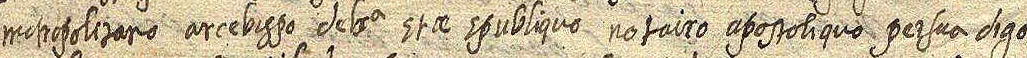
metropolitano arcebispo de lxa Etæ E publiquo notairo apostoliquo per sua digo
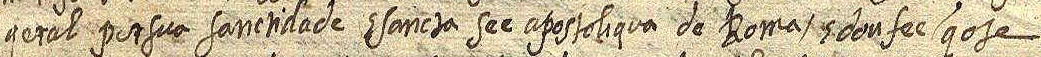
geral per sua sanctidade E sancta see apostoliqua de Roma / E dou fee q̄ oje
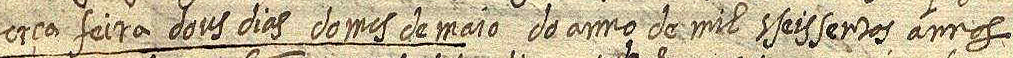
terça feira dous dias do mes de maio do anno de mil E seissentos annos
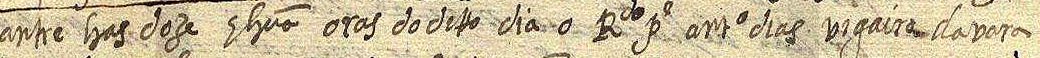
antre has doze E huā oras do ditto dia o Rdo pe anto dias vigairo da vara
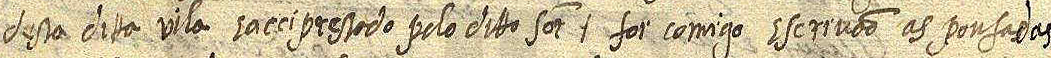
desta ditta villa E acciprestado pelo ditto sor̄ / foi comigo Escriuaõ as pousadas
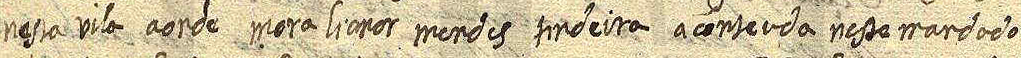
nesta vila aonde mora lianor mendes tindeira a conteuda neste mandado
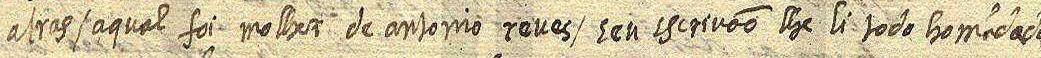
atras / a qual foi molher de antonio reues / E eu Escriuaõ lhe li todo ho mādado
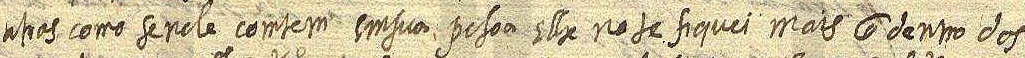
atras como se nele contem em sua pesoa E lhe notefiquei mais q̄ dentro dos
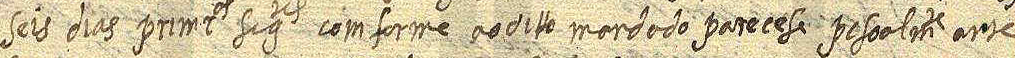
seis dias primros segtes comforme ao ditto mandado parecese pesoalmte ante
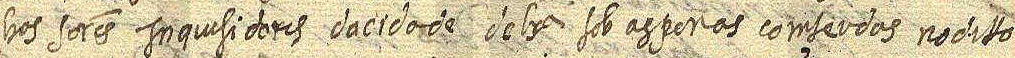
hos sorēs Jnquisidores da cidade de lxa sob as penas comteudas no ditto
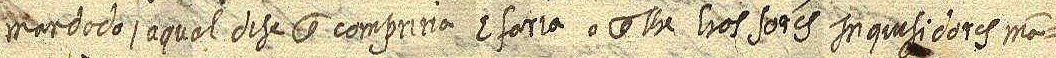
mandado / a qual dise q̄ compriria E faria o q̄ lhe hos sorēs Jnquisidores mā
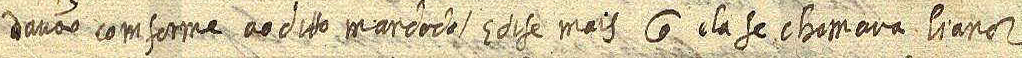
dauão comforme ao ditto mandado / E dise mais q̄ ela se chamaua lianor
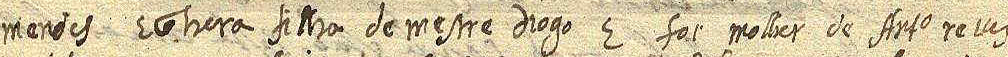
mendes E q̄ hera filha de mestre diogo E foi molher de Anto reues
